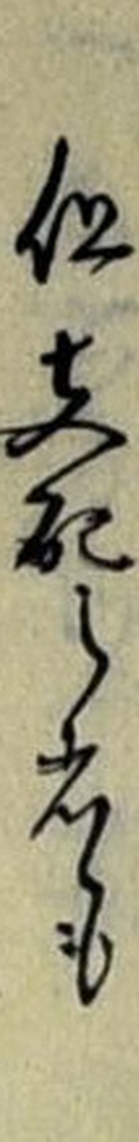但支配之者へも
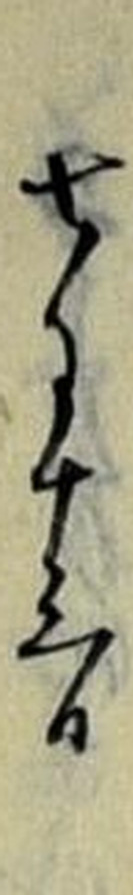七月十三日
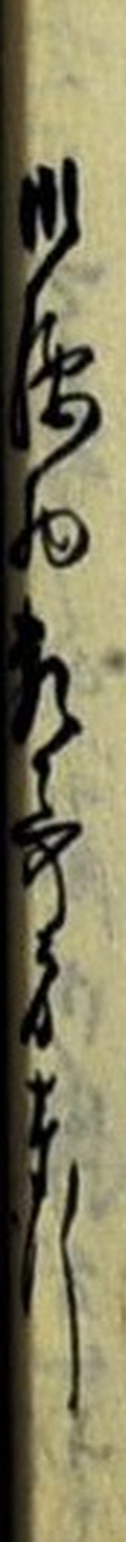御腰物数寄方奉行
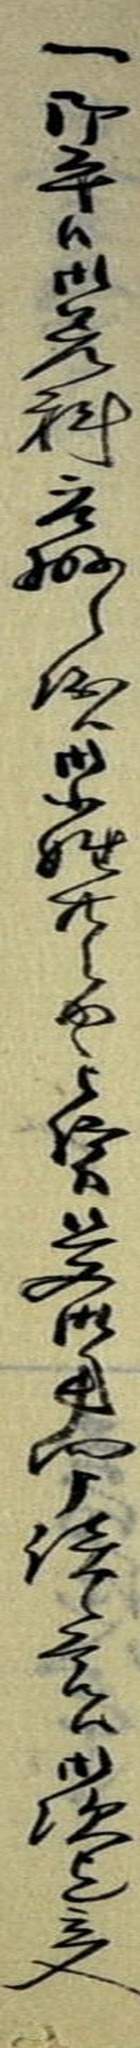一御平日御差料取扱之儀は御小姓共之内へ被仰付且又御用向申談候節は御次迄立入
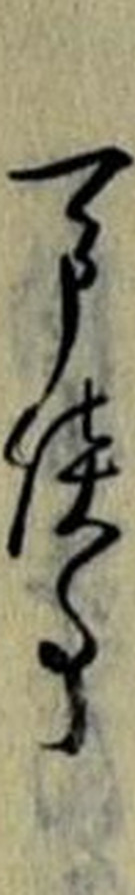可申談事
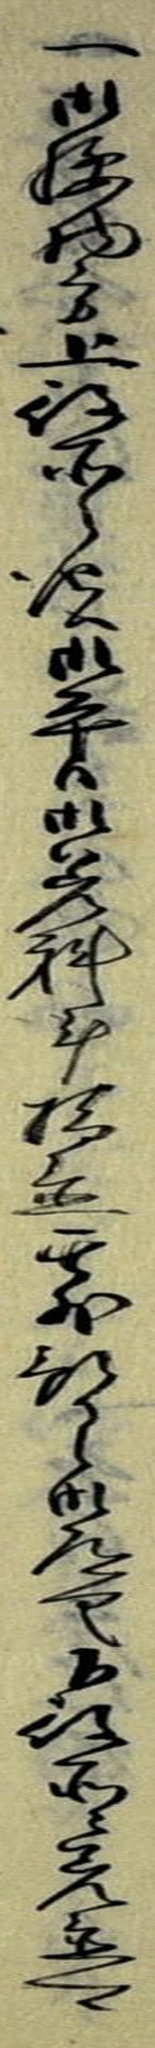一御腰物方上役所之儀は御平日御差料斗指置其外預り之御道具下役所に差置可
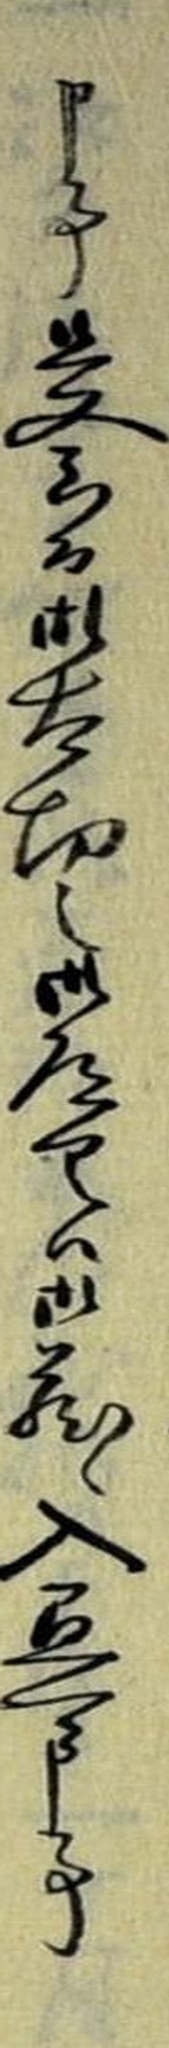申事且又至而御太切之御道具は御蔵へ入置可申事
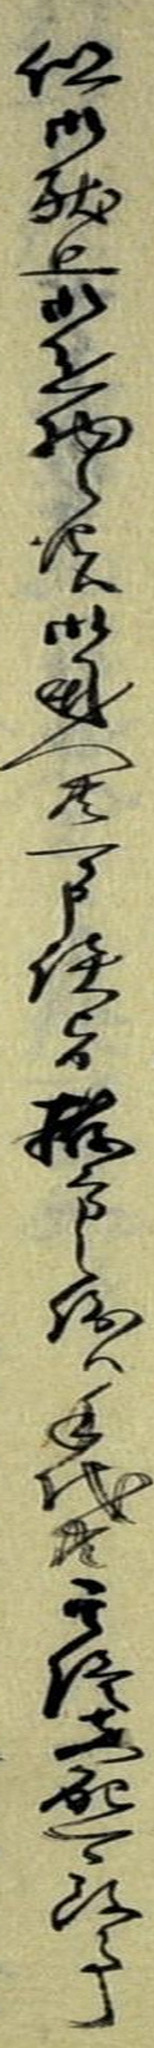但御献上御進物之儀は御用人共可申談旨拵方之儀は手代共其侭支配可致事
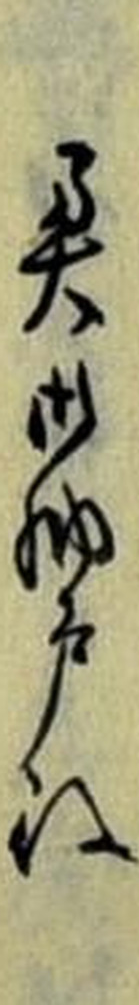奥御納戸役
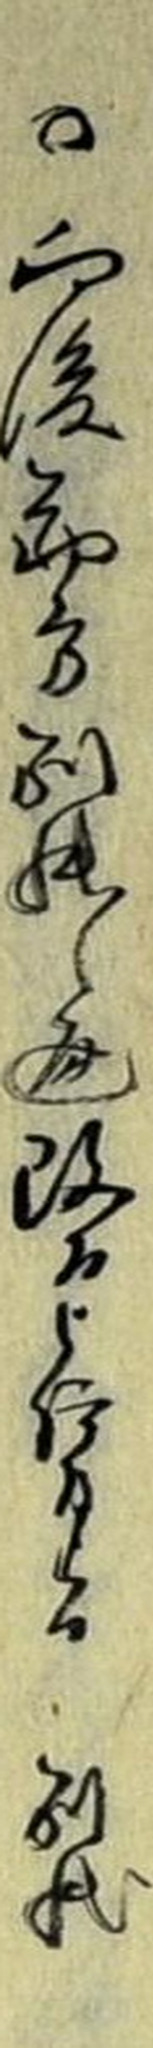〇向後勤方別紙之通改而被仰付旨別紙
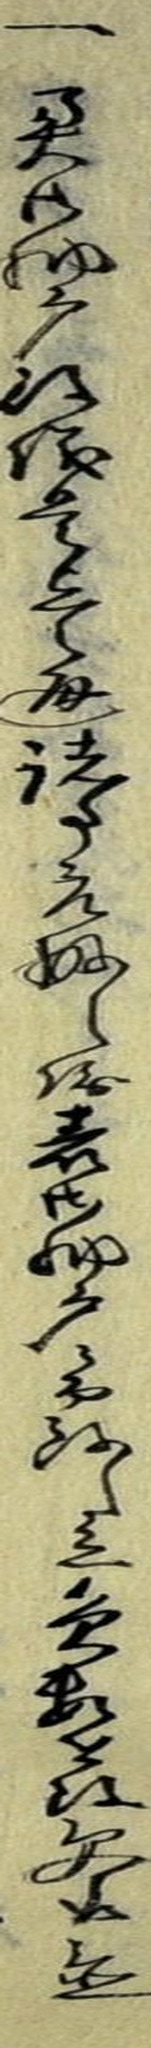一奥御納戸役儀是迄之通諸事取扱之儀表御納戸に而致し立員数を改受取置
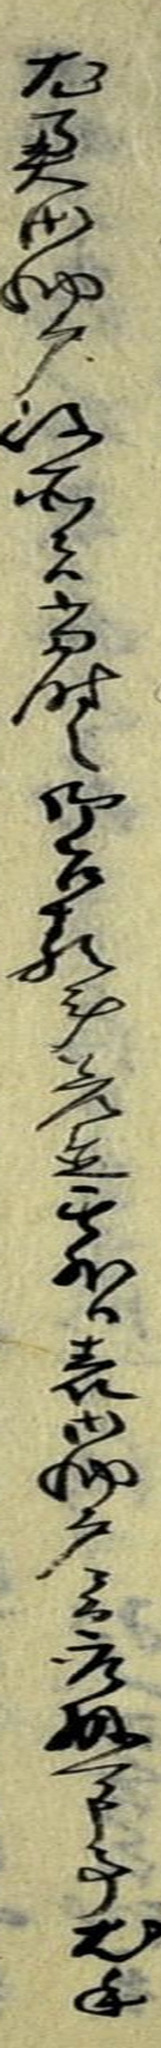尤奥納戸役所には当時之御召類斗差置其外は表御納戸に而取扱可申事尤手
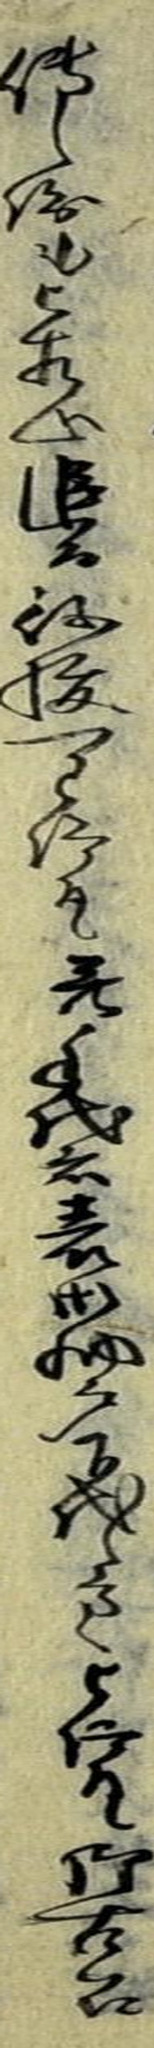伝之儀も被相止追而役援可被仰付候并手代者表御納戸下代之方へ被仰付候御古召
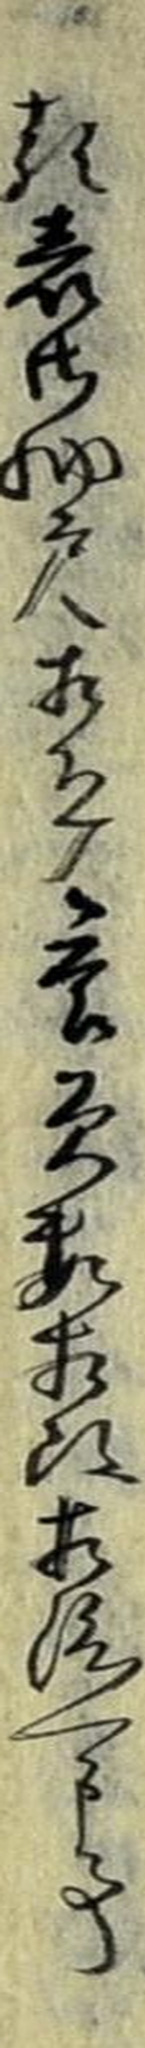類表御納戸へ相下け候節員数相改相渡可申事
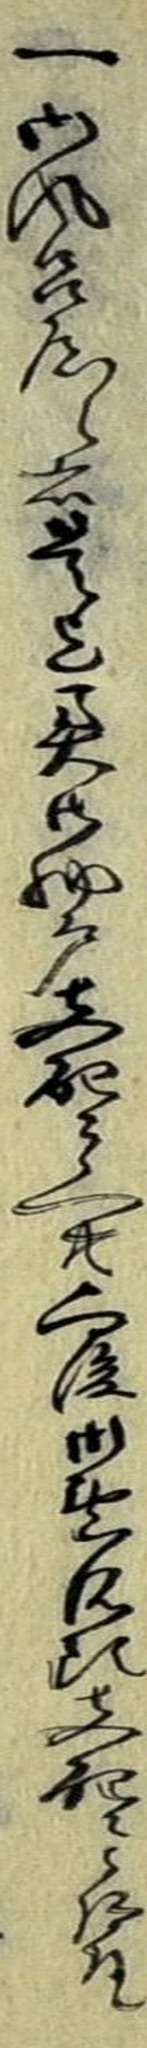一御風呂屋之者是迄奥御納戸支配に候へ共向後御台所頭支配に被仰付候
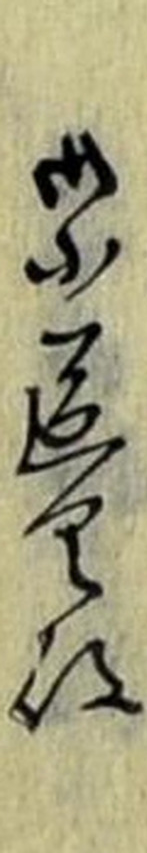御小道具役
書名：命令之部 二
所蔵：福井県文書館 Fukui Prefectural Archives
